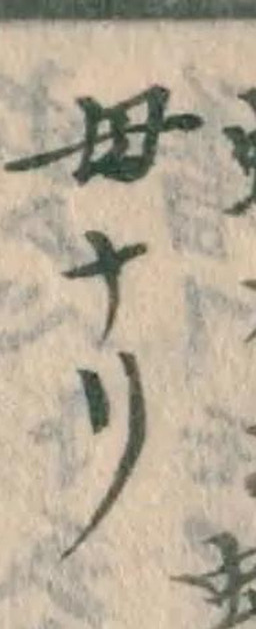母ナリ
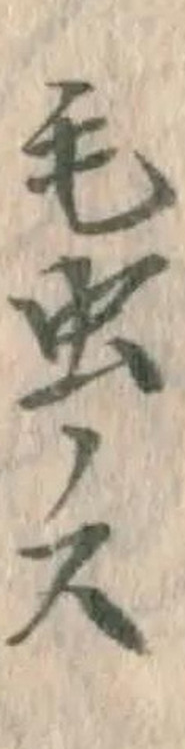毛虫ノス
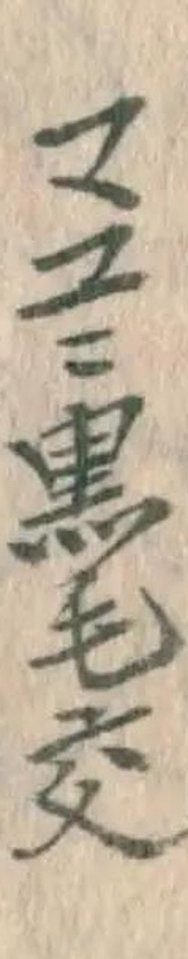マユニ黒毛交
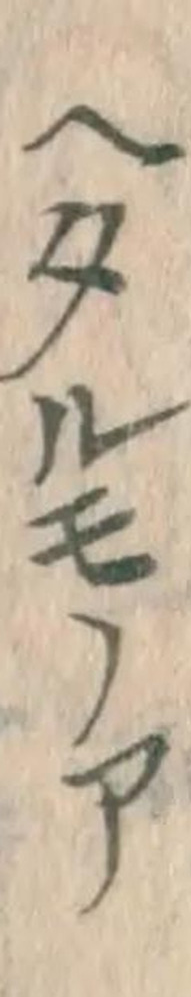ヘタルモノア

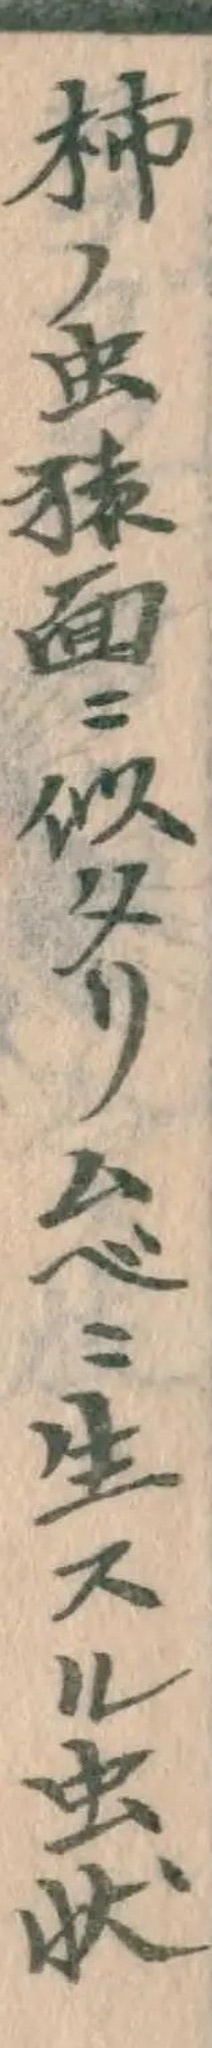柿ノ虫猿面ニ似タリムベニ生スル虫状
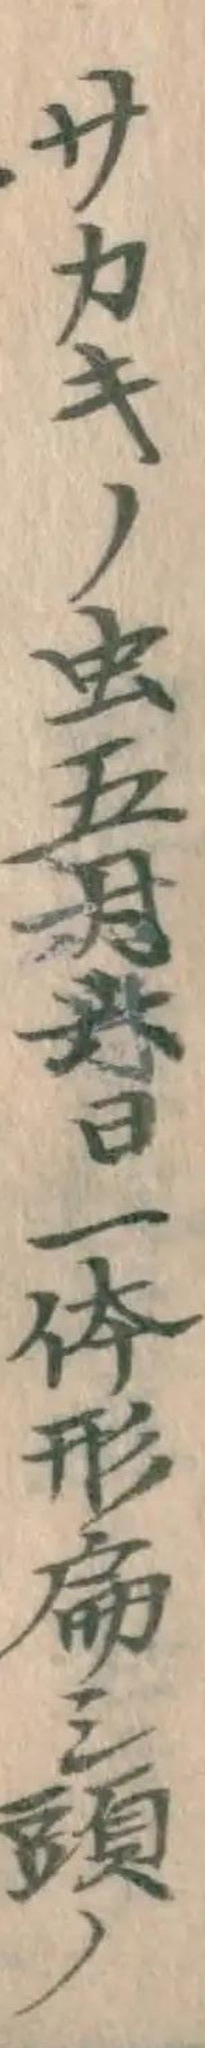サカキの虫五月六日一体形扁シ頭ノ
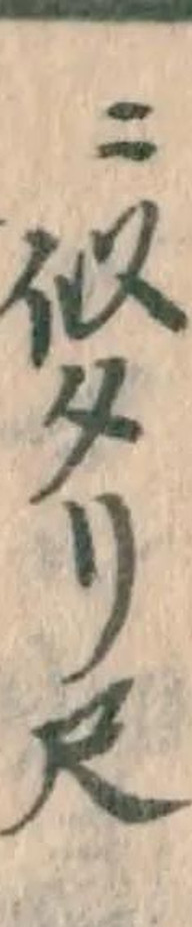ニ似タリ尺
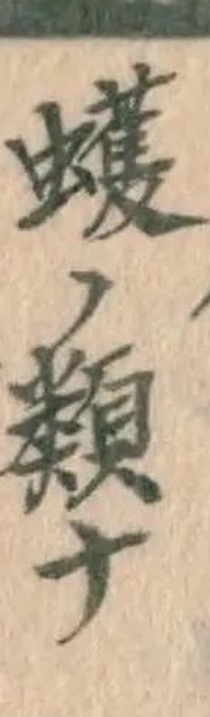蠖ノ類ナ
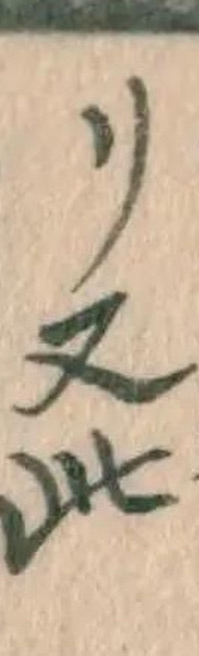リ又此
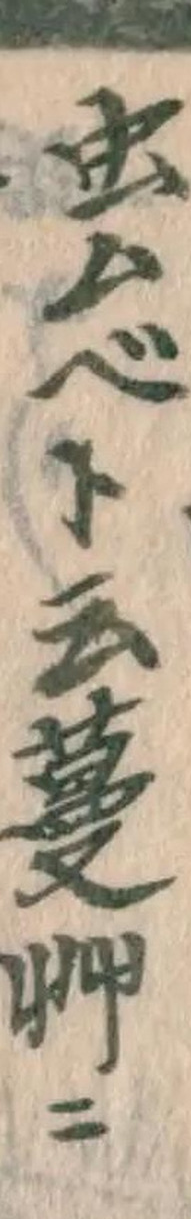虫ムベト云蔓草ニ
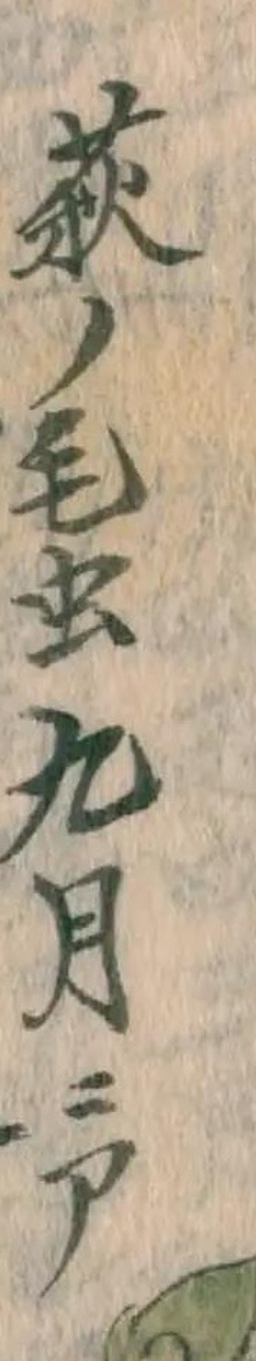萩ノ毛虫九月ニア
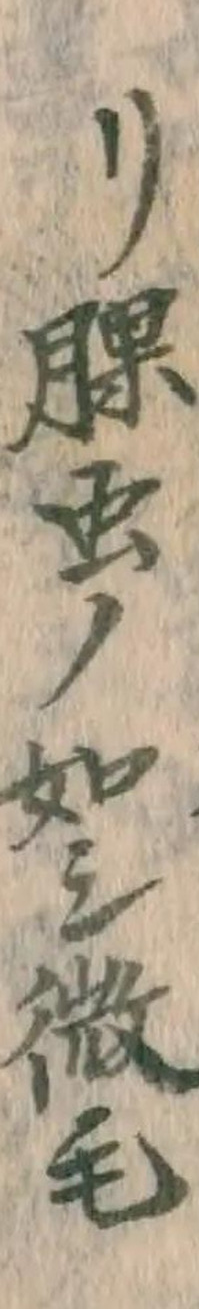リ腂虫ノ如シ微毛
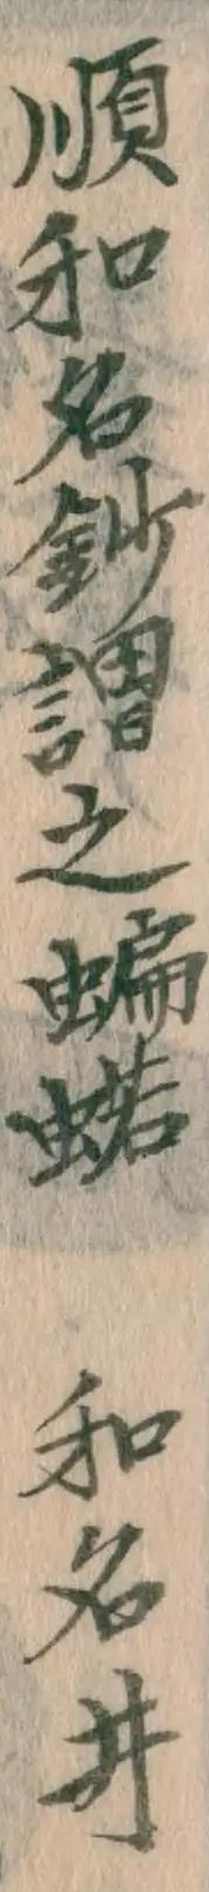順和名鈔謂是蝙𧍗和名ヰ
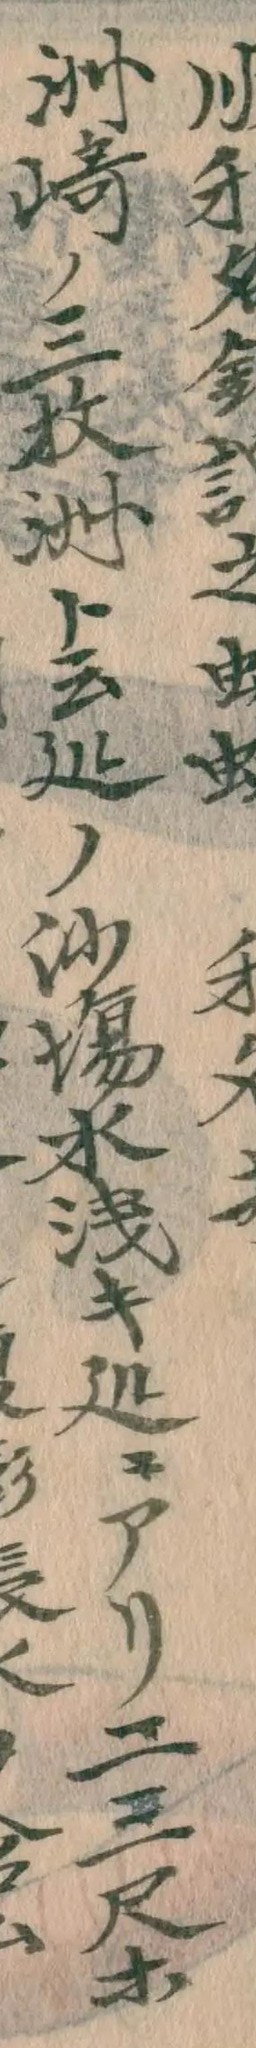洲崎ノ三枚洲ト云処ノ沙場水浅キ処ニアリ二三尺ホ
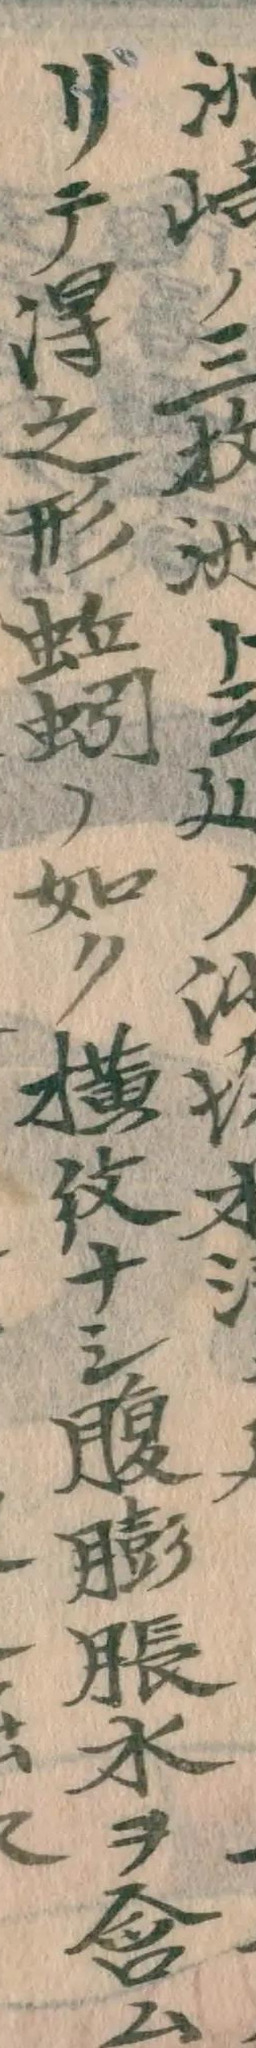リテ得之形蚯蚓ノ如ク横紋ナシ腹膨張水ヲ含ム
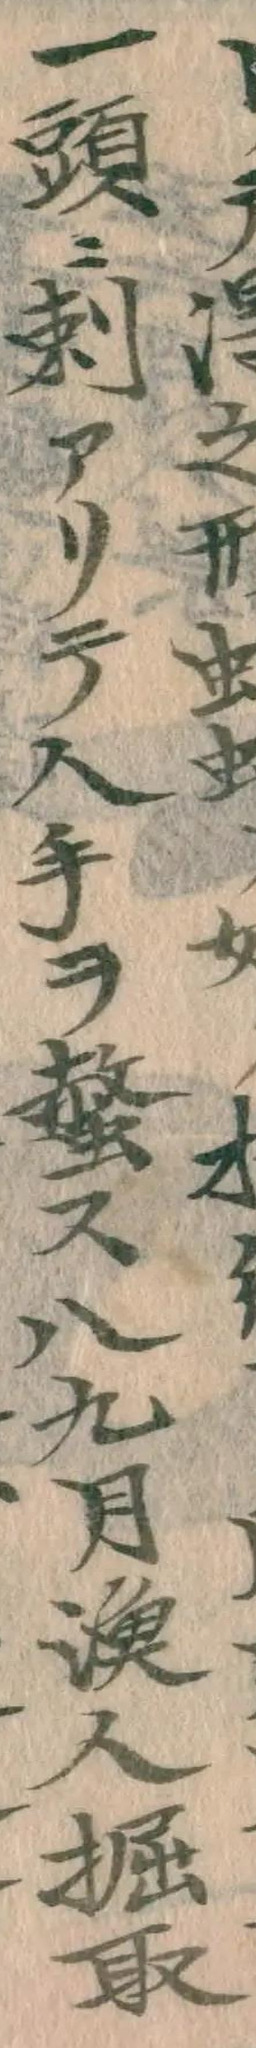一頭ニ刺アリテ人手ヲ螫ス八九月漁人掘取
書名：千蟲譜 3巻. [3]
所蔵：国立国会図書館 National Diet Library, JAPAN
